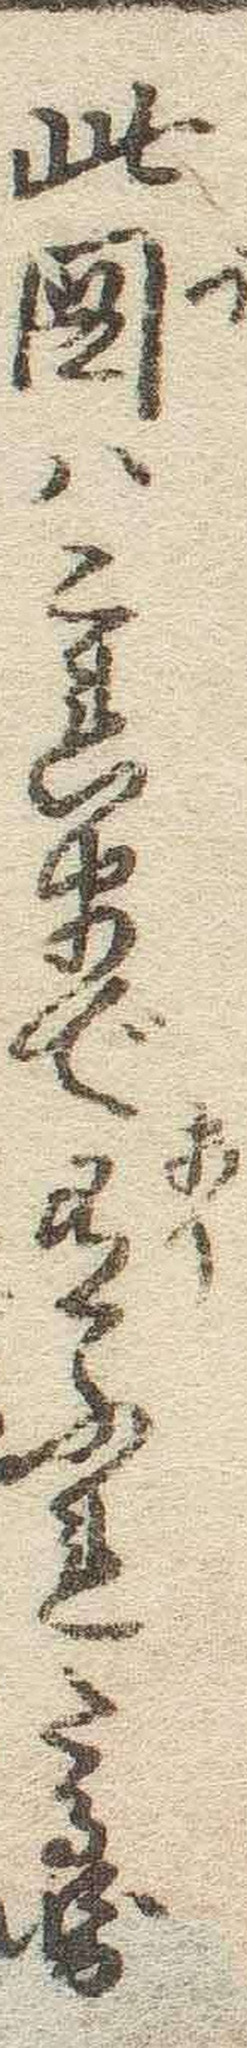此図はこれまで有ふれたる図
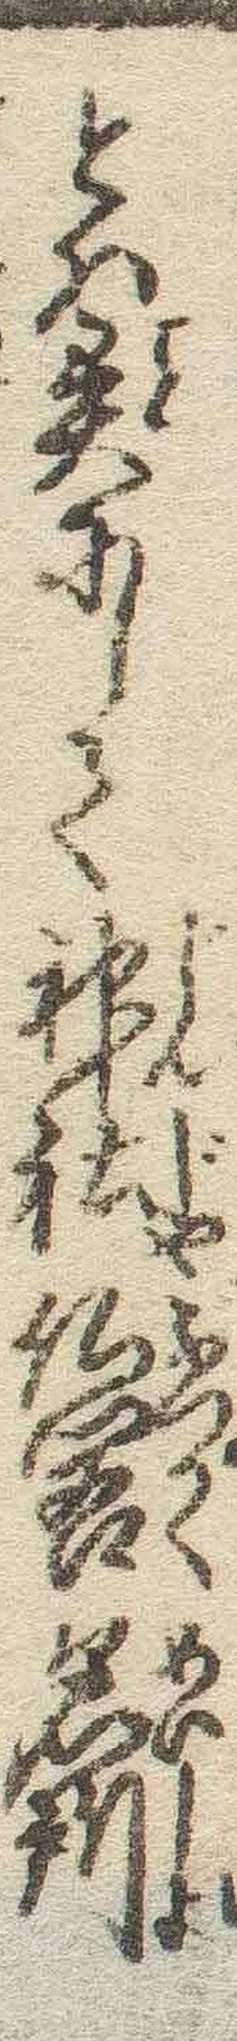とは異にして神社仏閣名所
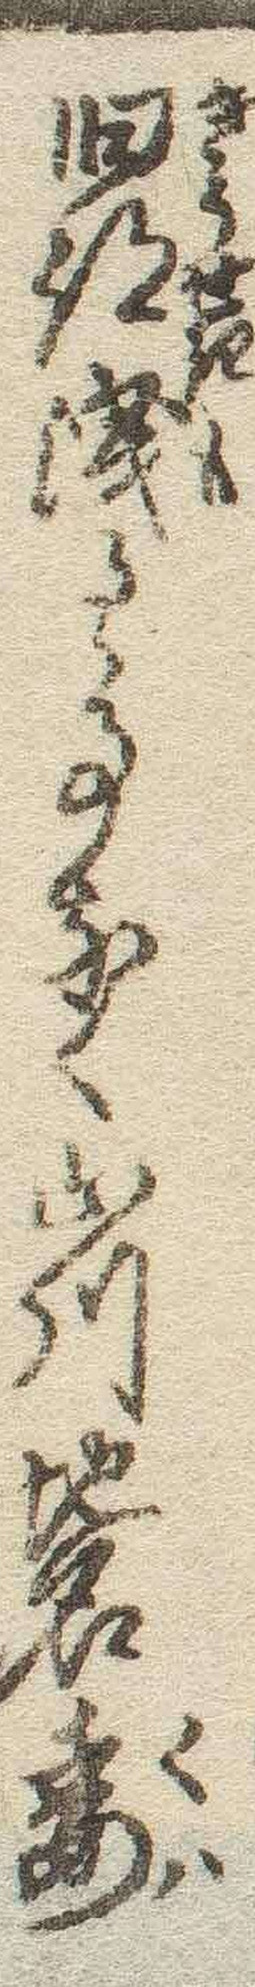旧跡洩るゝ事なく山川地名委
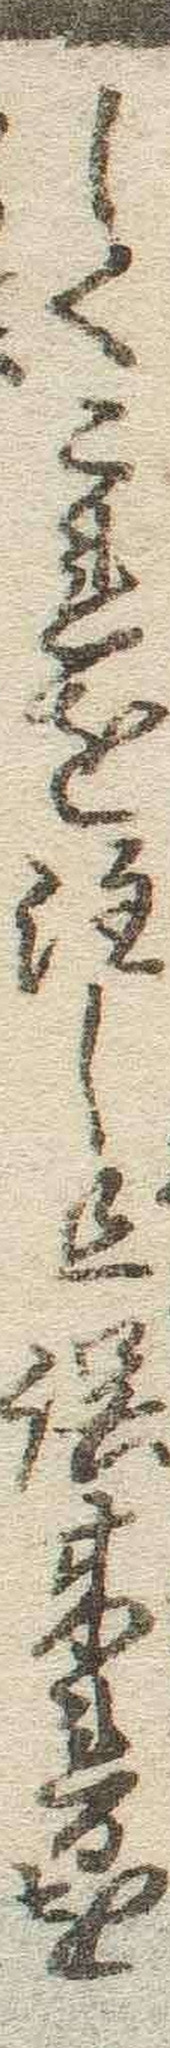しくこれを注し且誤来れるを
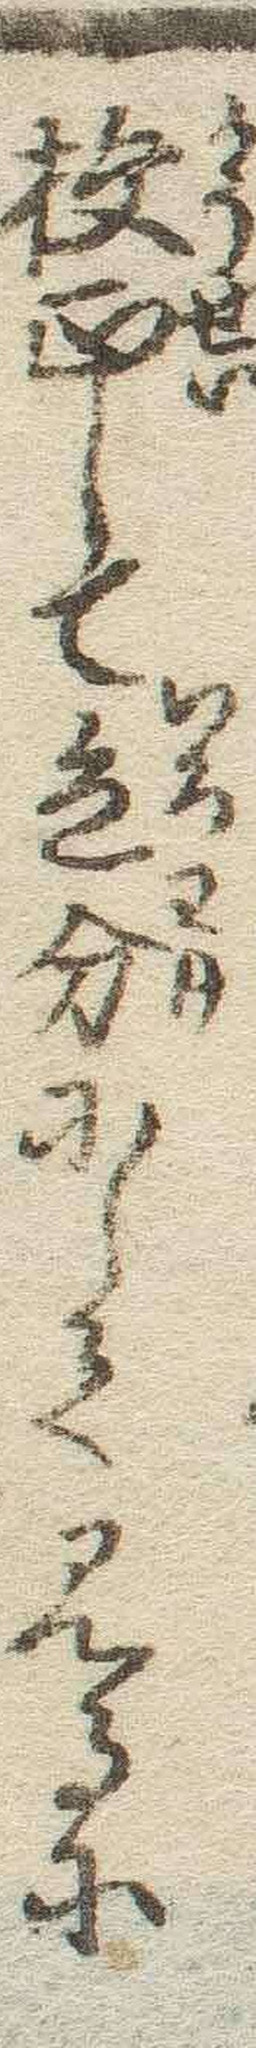校正して色分にして見るに
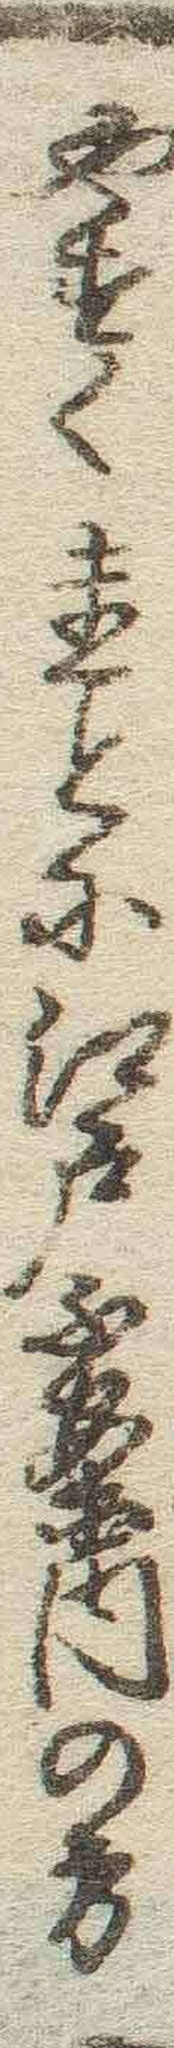やすくまことに江戸不案内の方
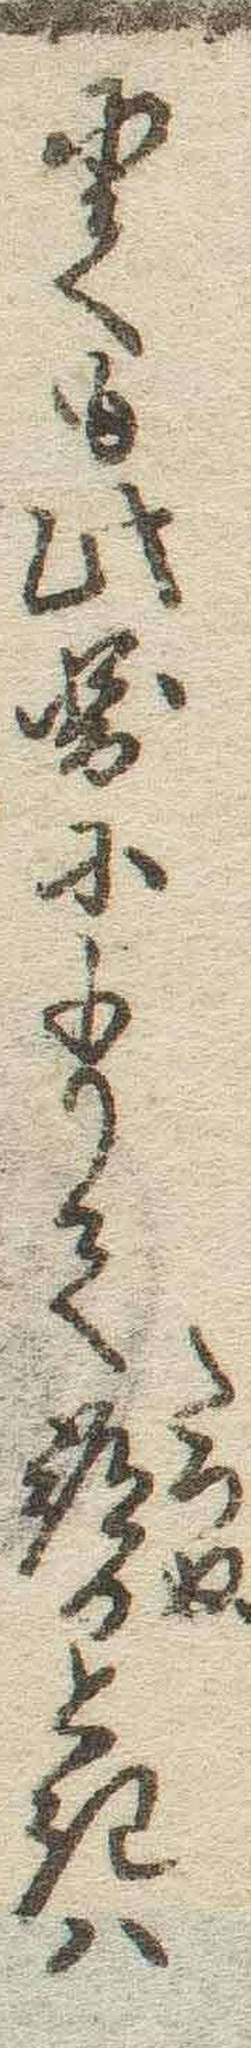にても此図によりて尋るときは
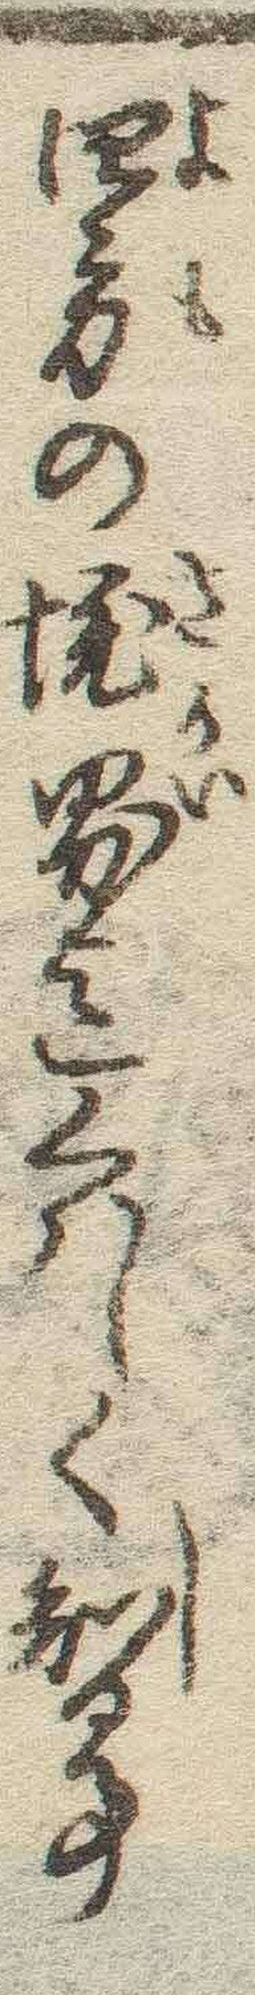四方の境界迄くはしく知る事
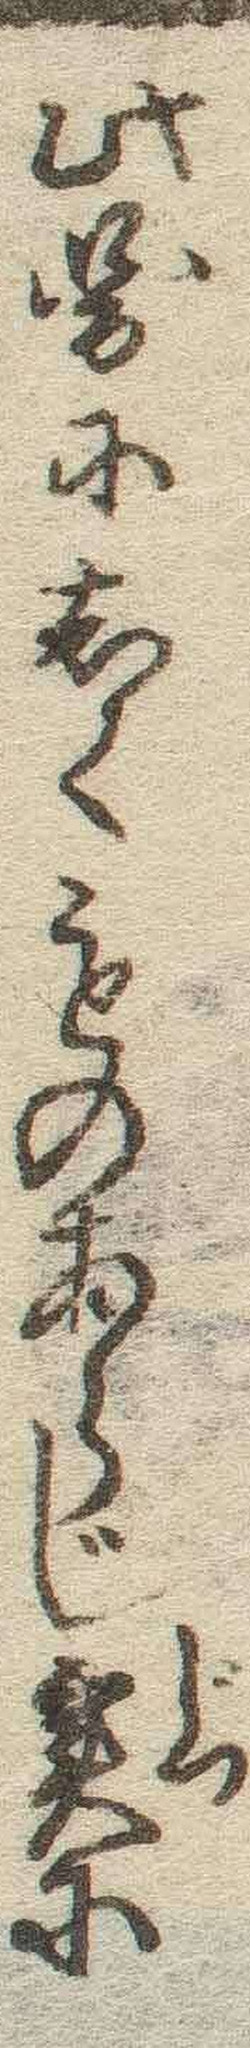此図にしくものあらじ実に
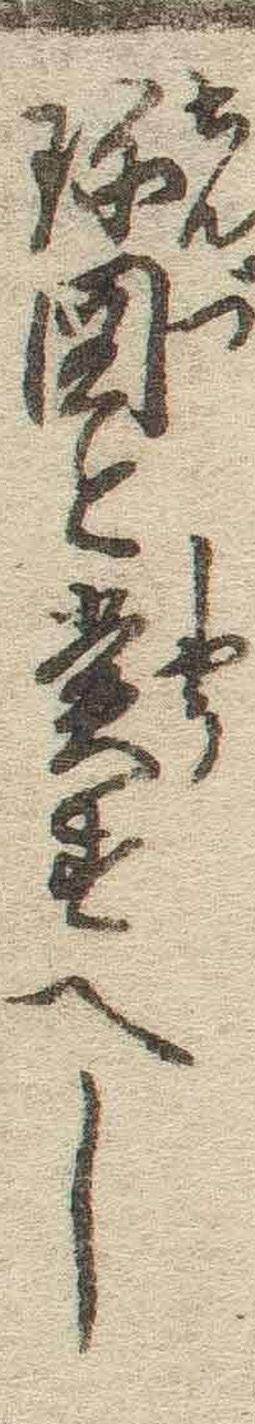珍図と賞すへし
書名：江戸町独案内
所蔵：東京学芸大学附属図書館 国文学研究資料館
